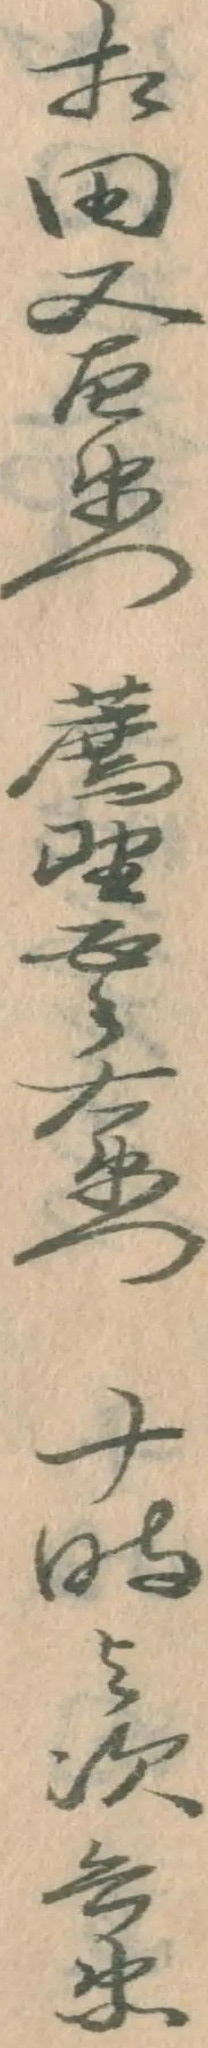相田又左衛門薦野五郎右衛門十時与次兵衛

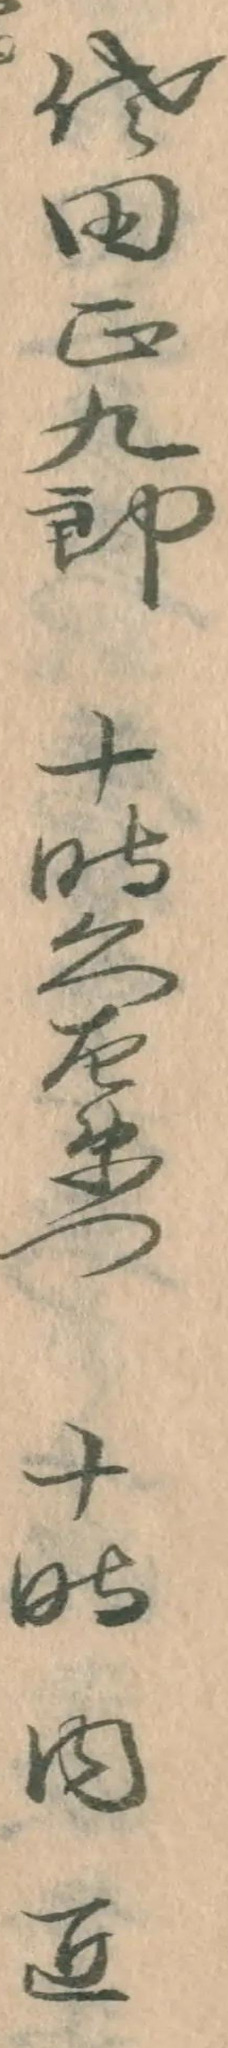佐田正九郎十時久左衛門十時内匠
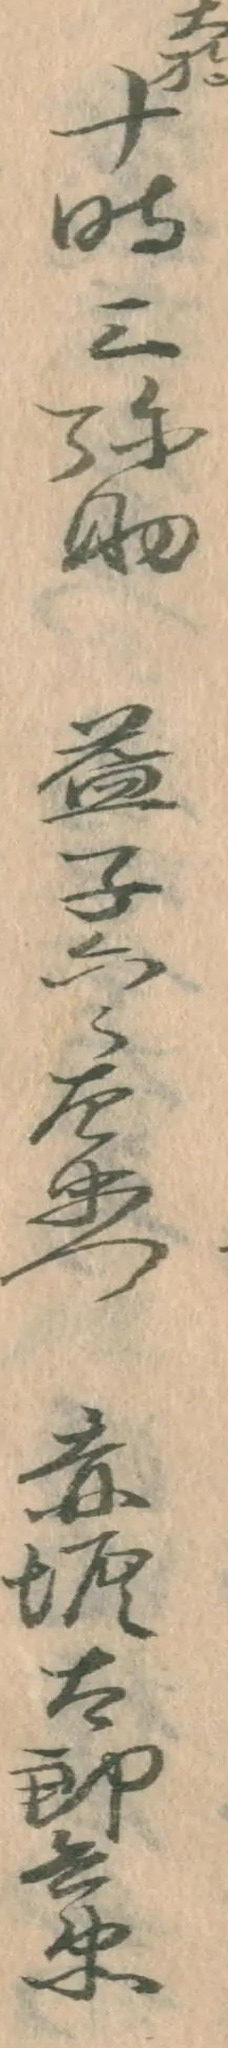十時三弥助益子六郎左衛門赤堀太郎兵衛
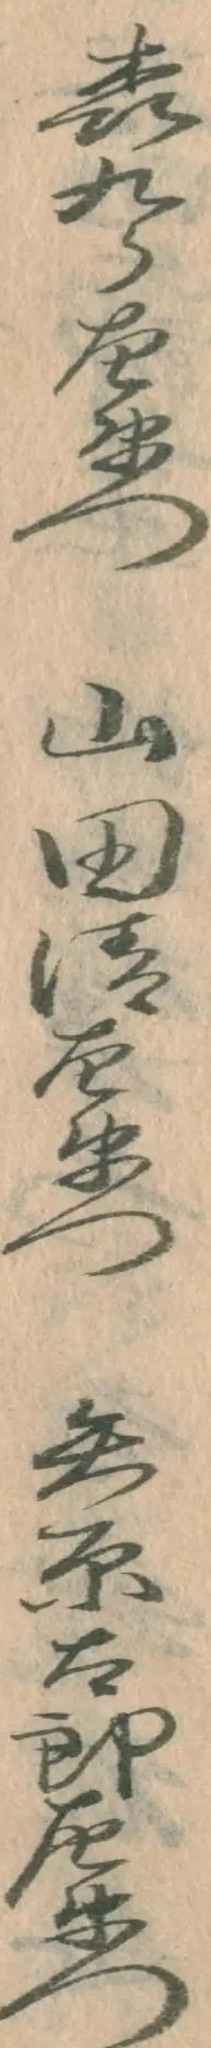森九郎左衛門山田清左衛門矢原太郎左衛門
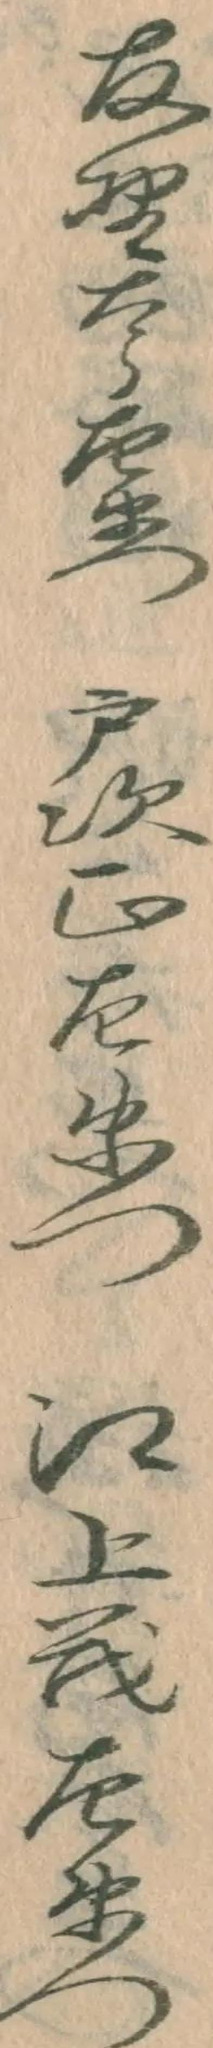友野太郎左衛門戸次正左衛門江上茂左衛門
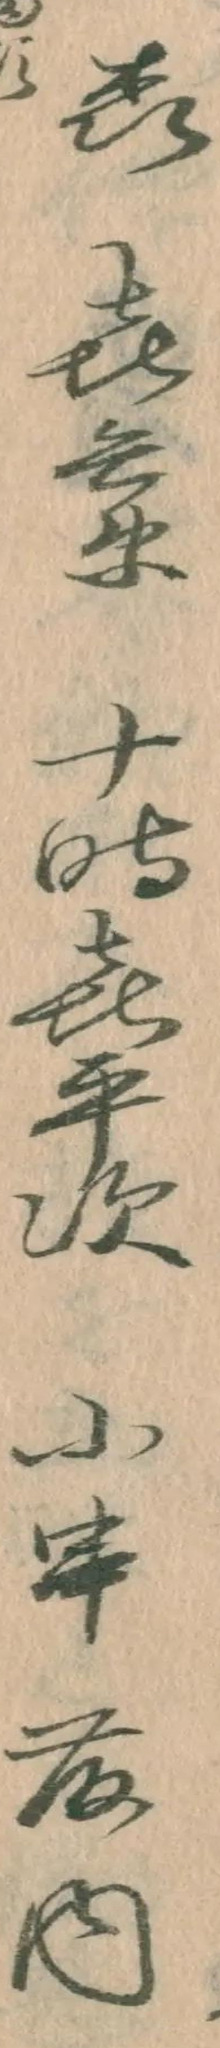森喜兵衛十時喜平次小串藤内
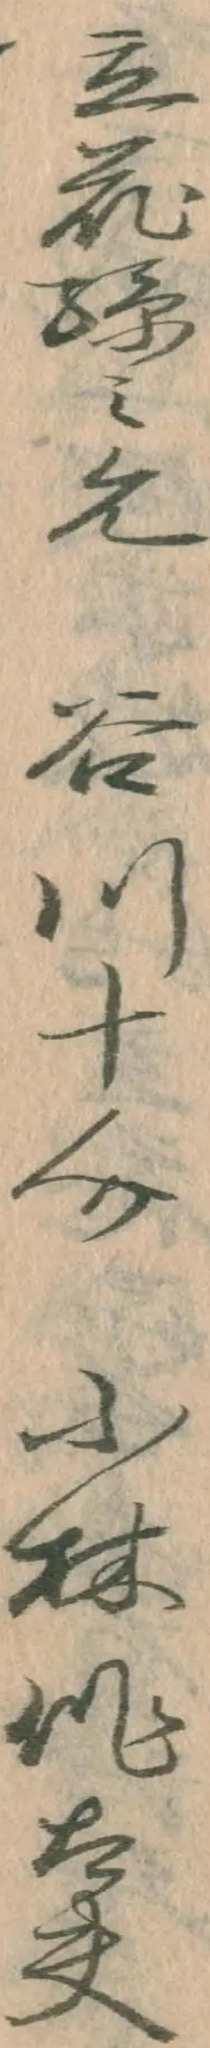立花孫之允谷川十介小林作太夫
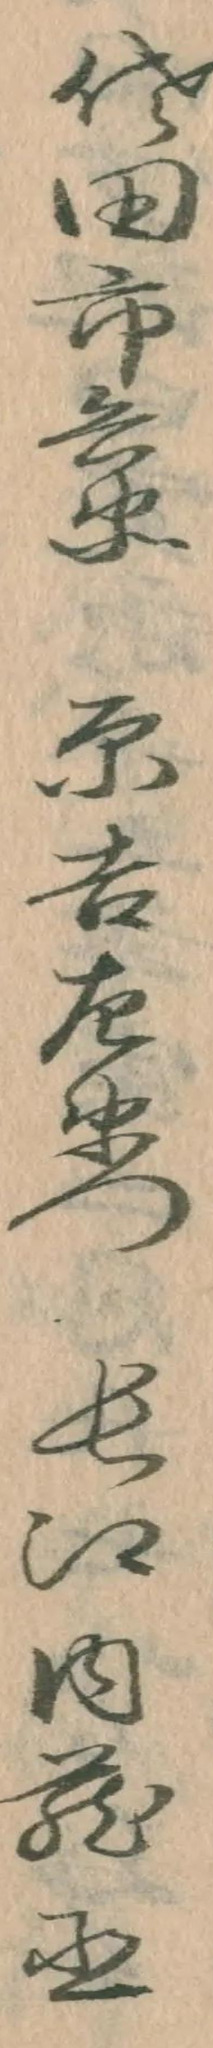佐田市兵衛原吉左衛門長江内蔵丞
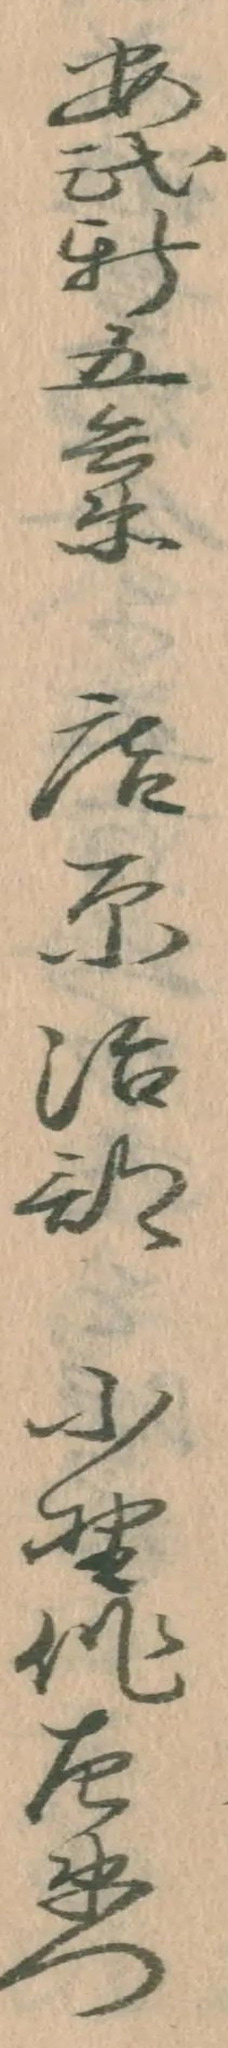安武新五兵衛広原治部小野作左衛門
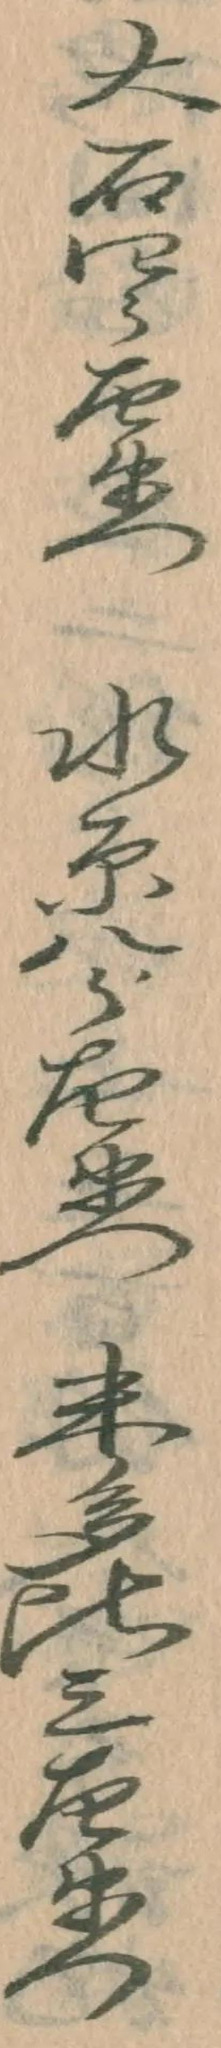大石四郎左衛門水原八郎左衛門末多比三左衛門
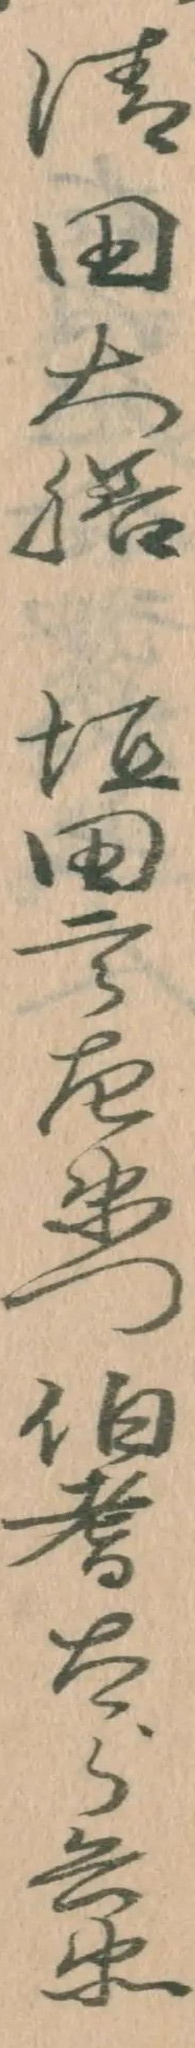清田大膳垣田二郎左衛門伯耆太郎兵衛
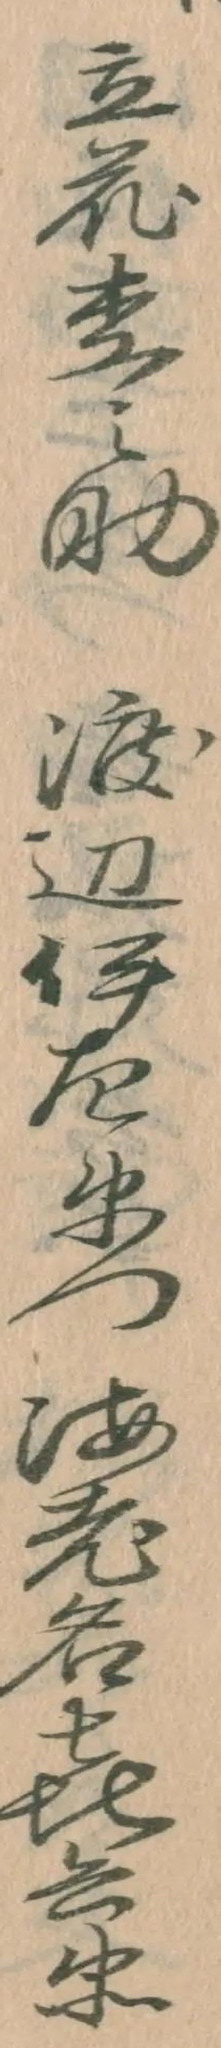立花杢之助渡辺伊左衛門海老名喜兵衛
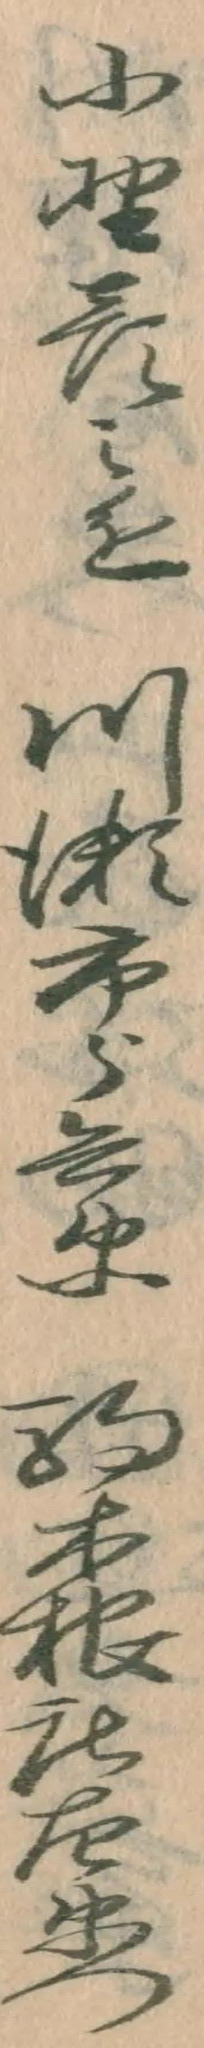小野彦之進川瀬市郎兵衛駒木根庄左衛門
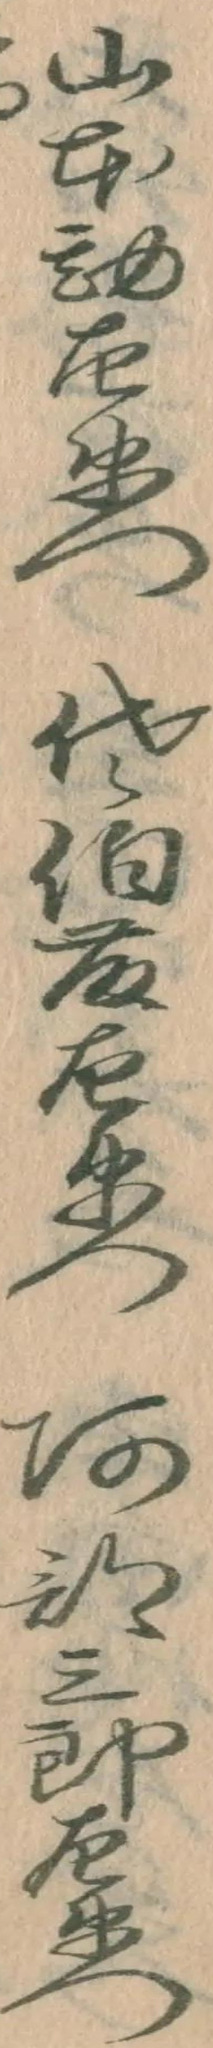山本勘左衛門佐伯藤左衛門河部三郎左衛門
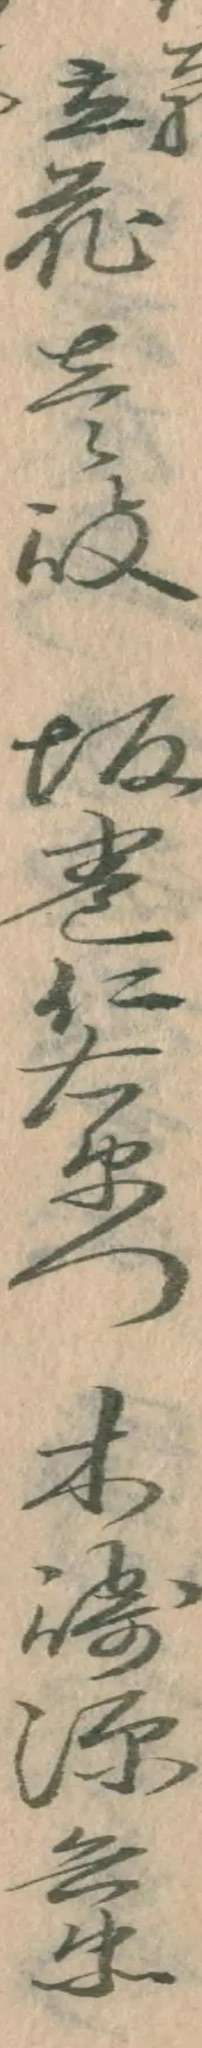立花壱岐坂巻仁右衛門木崎源兵衛
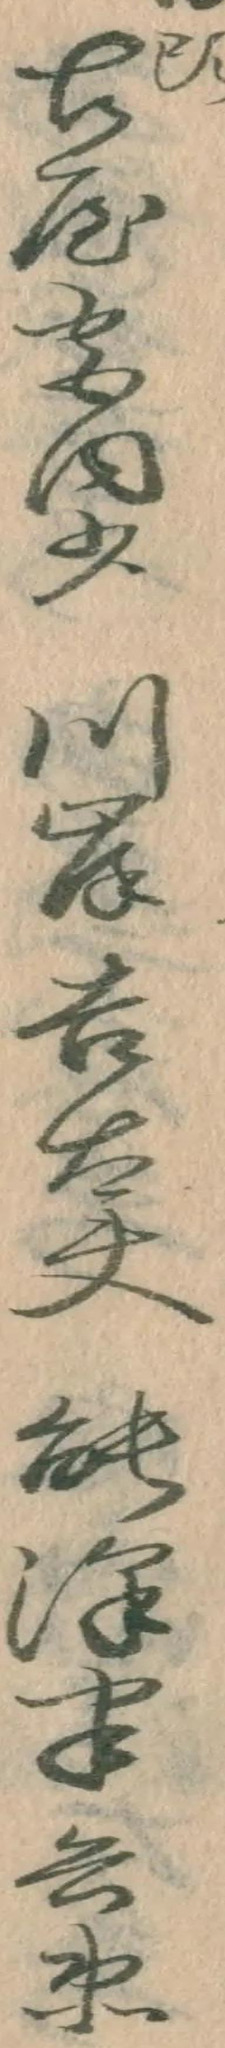古屋宮内少川岸吉太夫能沢半兵衛
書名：切支丹御退治記 49巻. [9]
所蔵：国立国会図書館 National Diet Library, JAPAN
